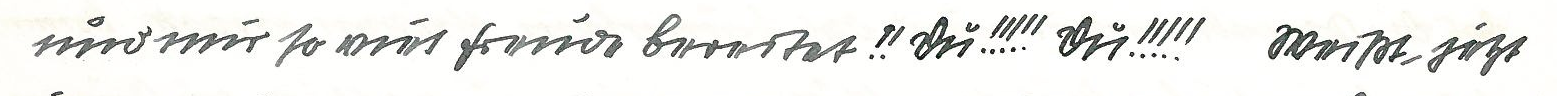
und mir so viel Freude bereitet?! Du!!!!! Du!!!!! Weißt, jetzt
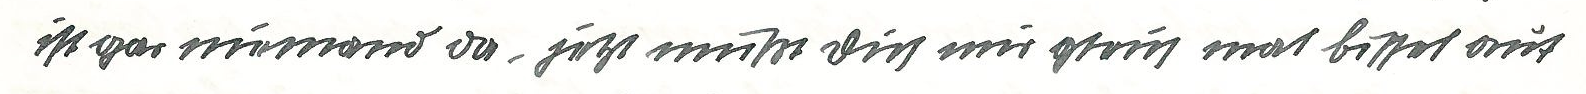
ist gar niemand da, jetzt mußt Dich mir gleich mal bissel auf
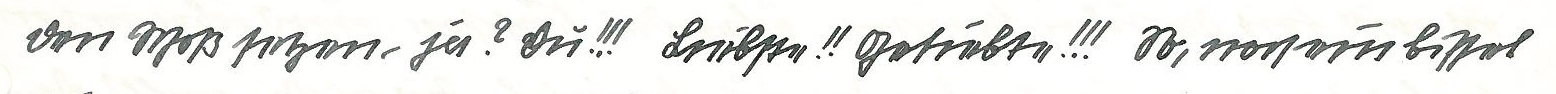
den Schoß setzen, ja? Du!!! Liebste!! Geliebte!!! So, noch ein bissel
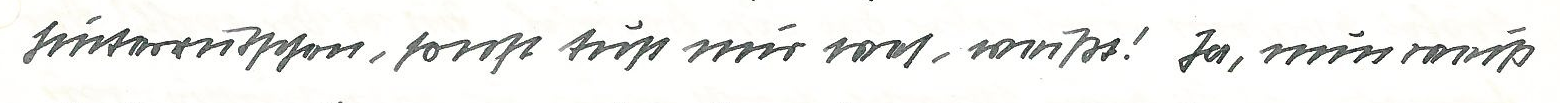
hinterrutschen, sonst tust mir weh, weißt! Ja, nun weiß
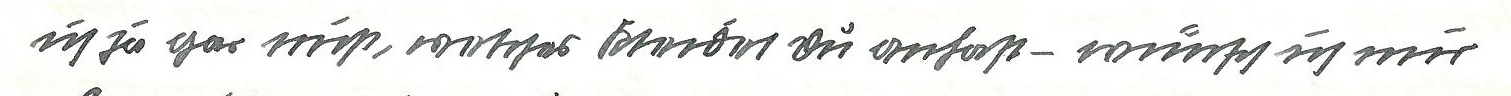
ich ja gar nicht, welches Kleidel Du anhast – wünscht ich mir
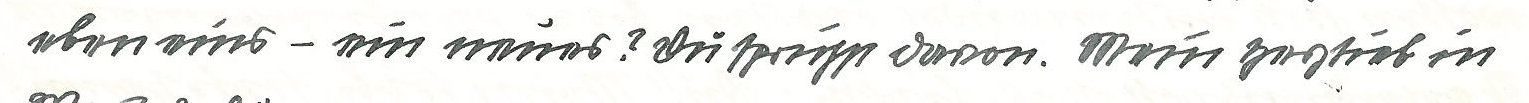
eben eins – ein neues? Du sprichst davon. Mein Herzlieb in
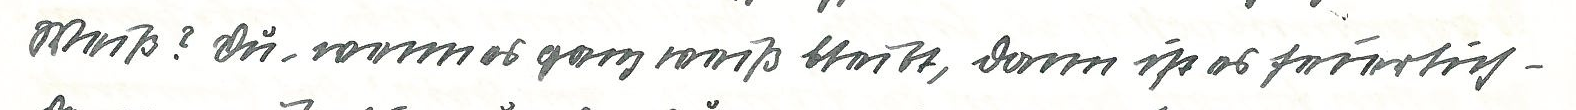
Weiß? Du, wenn es ganz weiß bleibt, dann ist es feierlich –
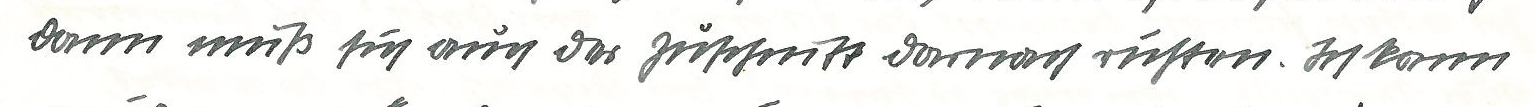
dann muß sich auch der Zuschnitt darnach richten. Ich kann
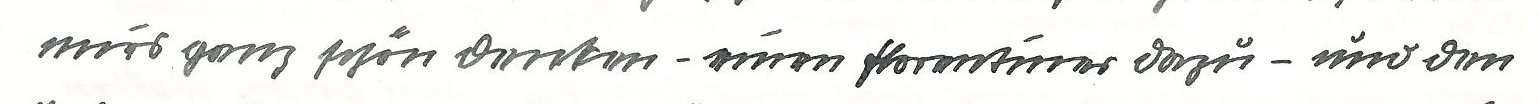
mirs ganz schön denken – einen Florentiner dazu – und den
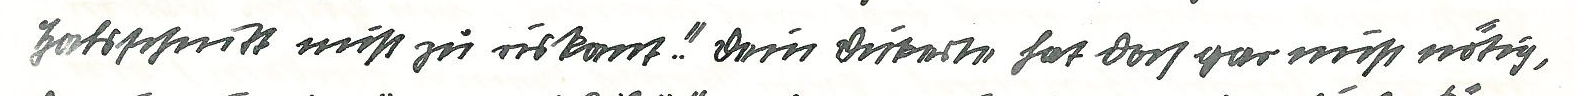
Halsschnitt nicht zu riskant!! Dein Dickerle hat doch gar nicht nötig,
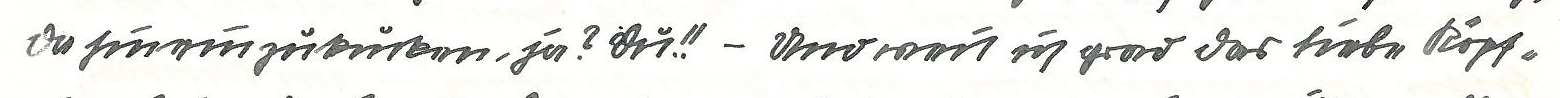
da hinein zu kucken, ja? Du!! – Und weil ich grad das liebe Köpf¬
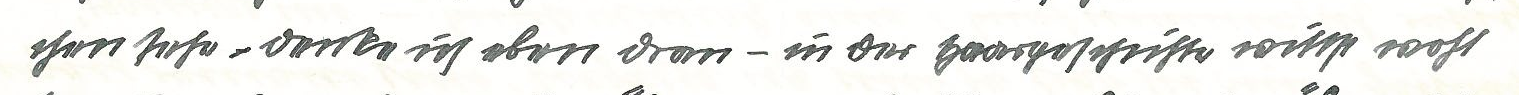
chen sehe, denke ich eben dran – in der Haargeschichte willst wohl
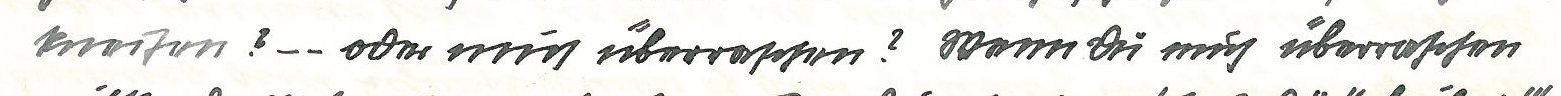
kneifen? – – oder mich überraschen? Wenn Du mich überraschen
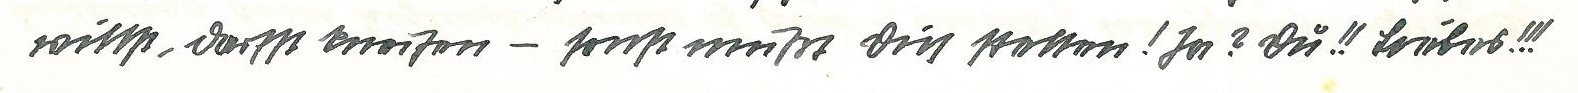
willst, darfst kneifen – sonst mußt Dich stellen! Ja? Du!! Liebes!!!
